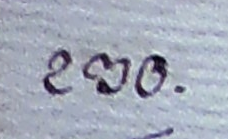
230.
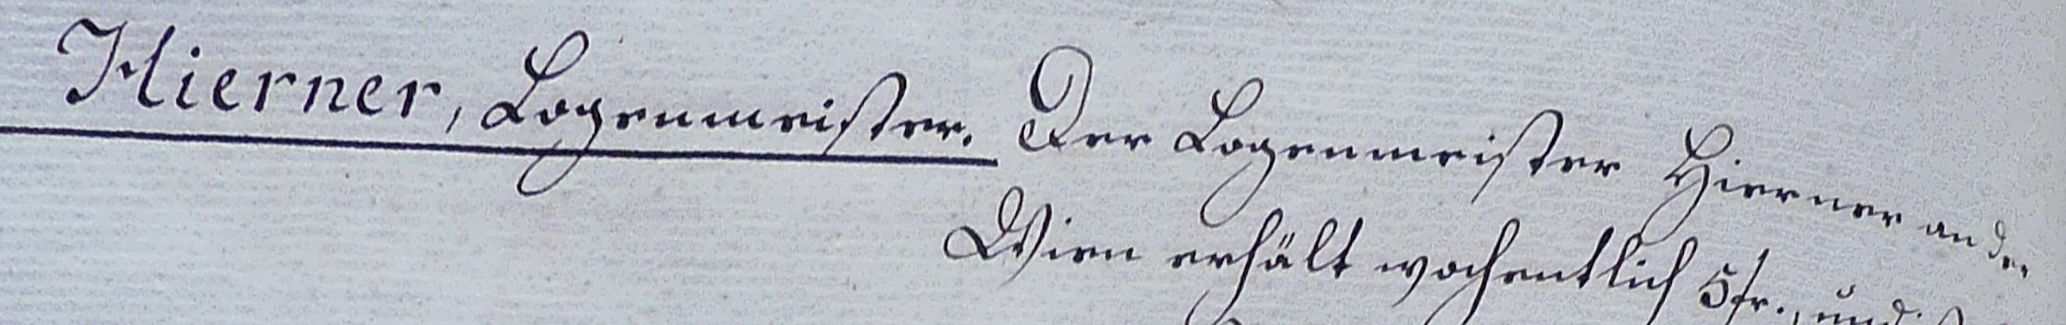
Hierner, Logenmeister. Der Logenmeister Hierner an der
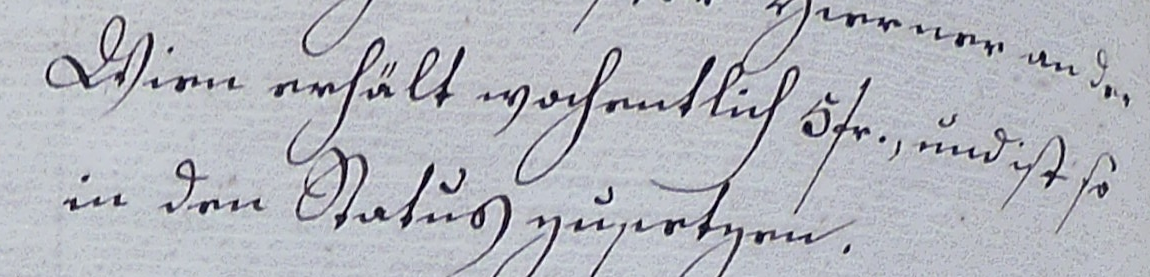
Wien erhält wochentlich 5fr., und ist so
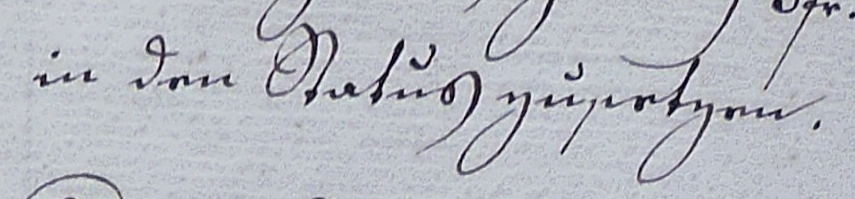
in den Status zusetzen.
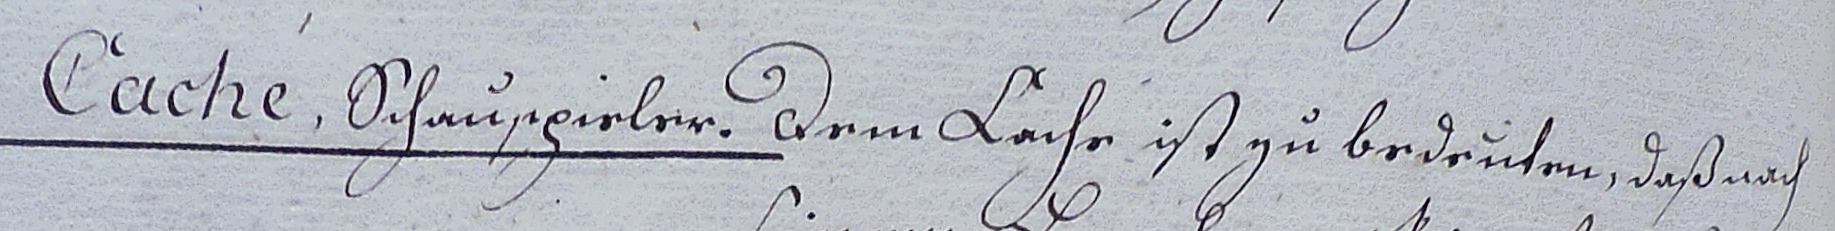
Caché, Schauspieler. Dem Cache ist zu bedeuten, daß nach
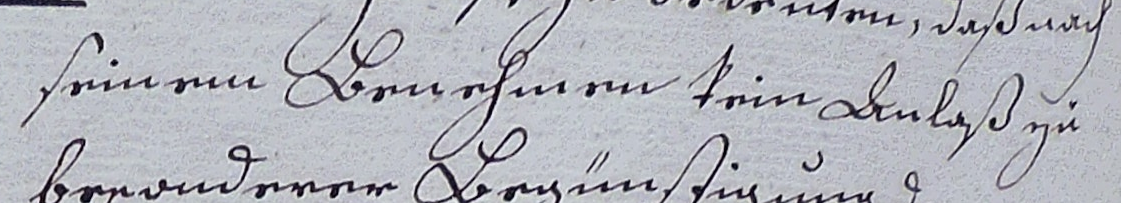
seinem Benehmen kein Anlaß zu
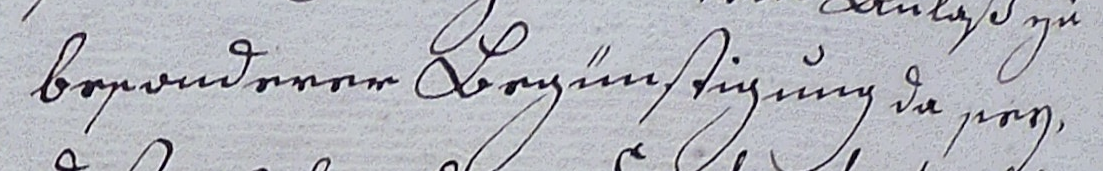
besonderer Begünstigung da sey,
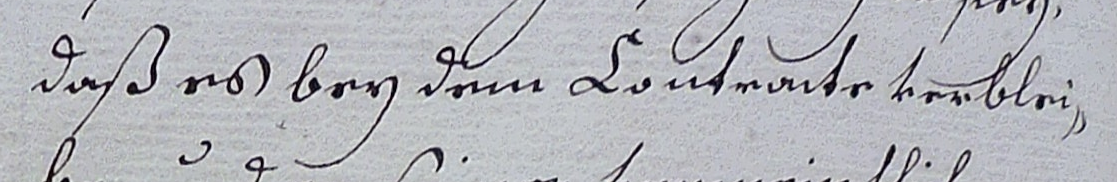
daß es bey dem Contracte verblei¬
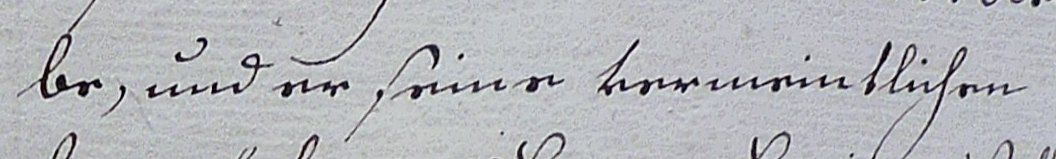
be, und er seine vermeintlichen
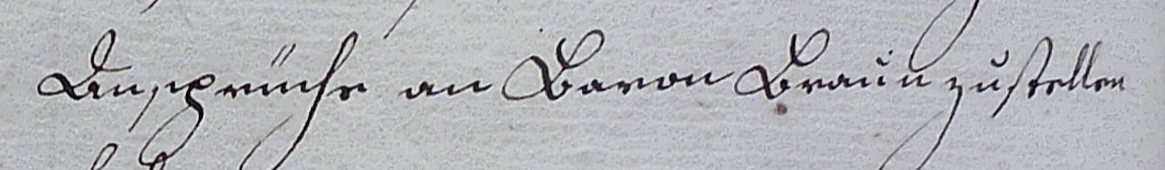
Ansprüche an Baron Braun zustellen
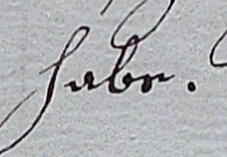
habe.
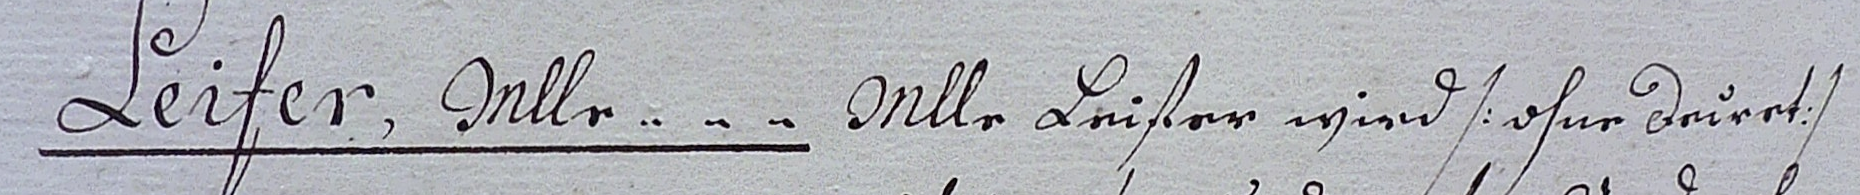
Leifer, Mlle .. .. .. Mlle Leifer wird ohne |:ohne Decret:|
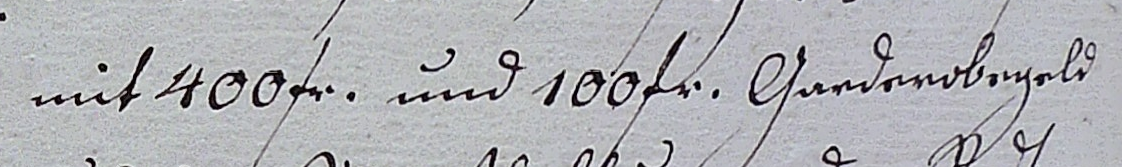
mit 400fr. und 100fr. Garderobegeld
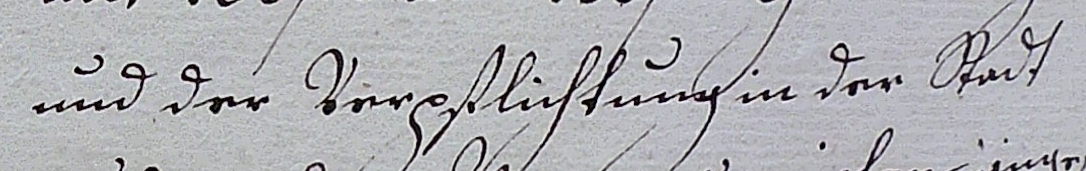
und der Verpflichtung in der Stadt
